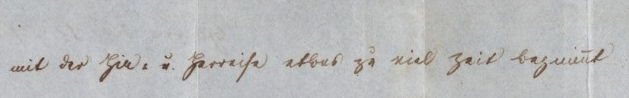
mit der Hin- und Herreise etwas zu viel Zeit wegnimmt.
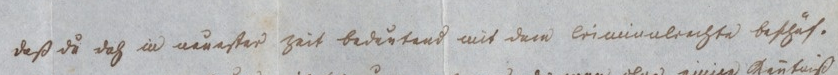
Daß du dich in neuester Zeit bedeutend mit dem Criminalrechte beschäf-
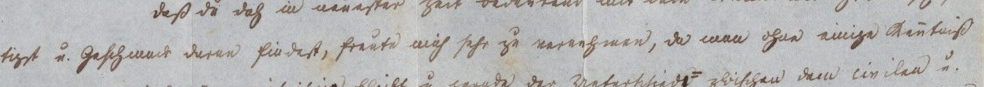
tigst u. Geschmack daran findest, freute mich sehr zu vernehmen, da man ohne einige Kenntniß
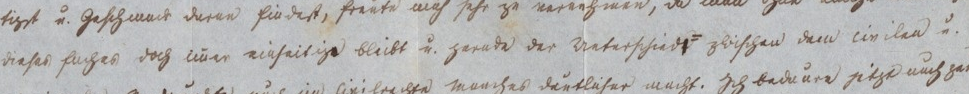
dieses Faches doch immer einseitig bleibt u. gerade der Unterschied zwischen dem civilen u.
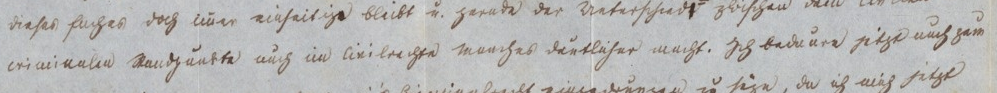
criminalen Standpunkte auch im Civilrechte Manches deutlicher macht. Ich bedaure jetzt auch zum
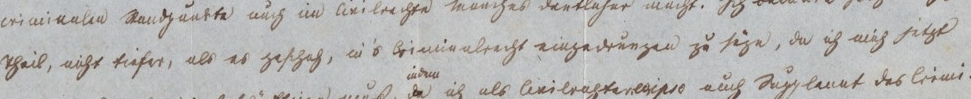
Theil, nicht tiefer, als es geschah, in's Criminalrecht eingedrungen zu seyn, da ich mich jetzt
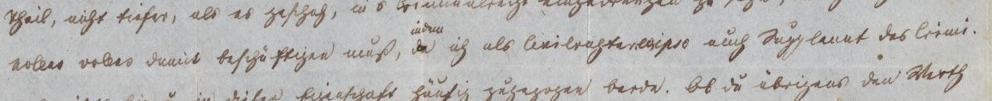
nolens volens damit beschäftigen muß, daindem ich als Civilrichter eo ipso auch Suppleant des Crimi-
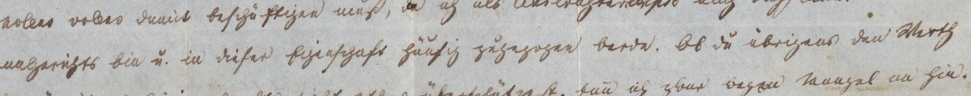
nalgerichts bin u. in dieser Eigenschaft häufig zugezogen werde. Ob du übrigens den Werth
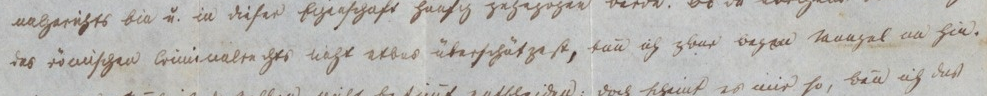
des römischen Criminalrechts nicht etwas überschätzest, kann ich zwar wegen Mangel an hin-
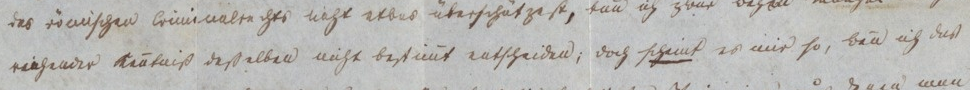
reichender Kenntniß desselben nicht bestimmt entscheiden; doch scheint es mir so, wenn ich das
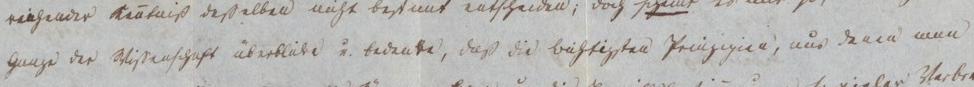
Ganze der Wissenschaft überblicke u. bedenke, daß die wichtigsten Prinzipien, aus denen man
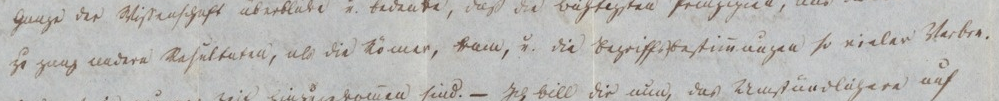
zu ganz andern Resultaten, als die Römer, kam, u. die Begriffsbestimmungen so vieler Verbre-
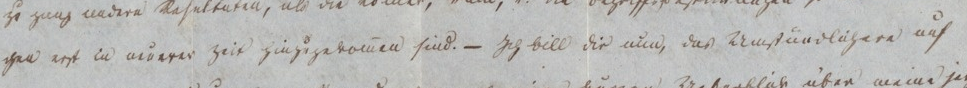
chen erst in neuerer Zeit hinzugekommen sind. – Ich will dir nun, das Umständlichere auf
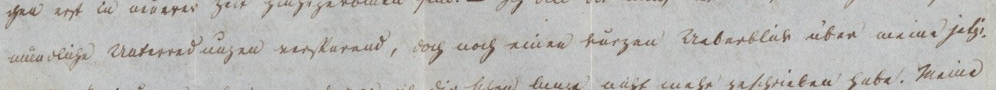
mündliche Unterredungen versparend, doch noch einen kurzen Ueberblick über meine jetzi-
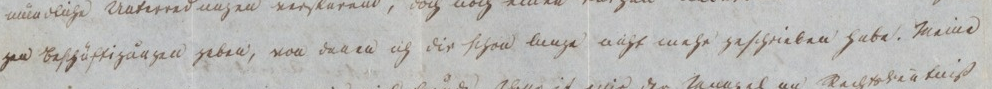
gen Beschäftigungen geben, von denen ich dir schon lange nicht mehr geschrieben habe. Meine
